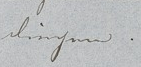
dingen.
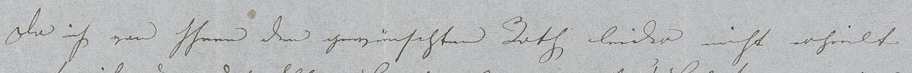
Da ich von Ihnen den gewünschten Rath leider nicht erhielt
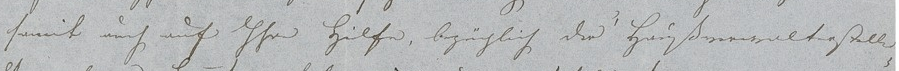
somit auch auf Ihre Hülfe, bezüglich der Haußverwalterstelle
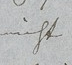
nicht
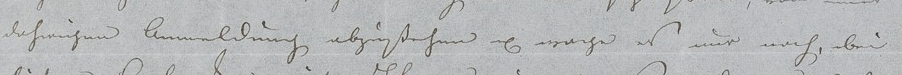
daherigen Anmeldung abzustehen & wage es nur noch, bei
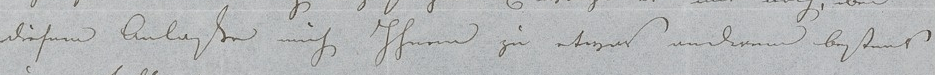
diesem Anlaße mich Ihnen zu etwas anderem bestens
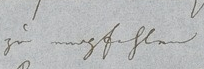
zu empfehlen.
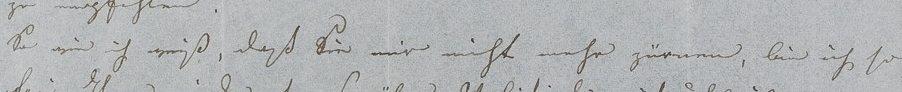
So wie ich weiß, daß Sie mir nicht mehr zürnen, bin ich so
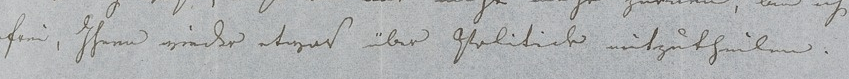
frei, Ihnen wieder etwas über Politick mitzutheilen.
